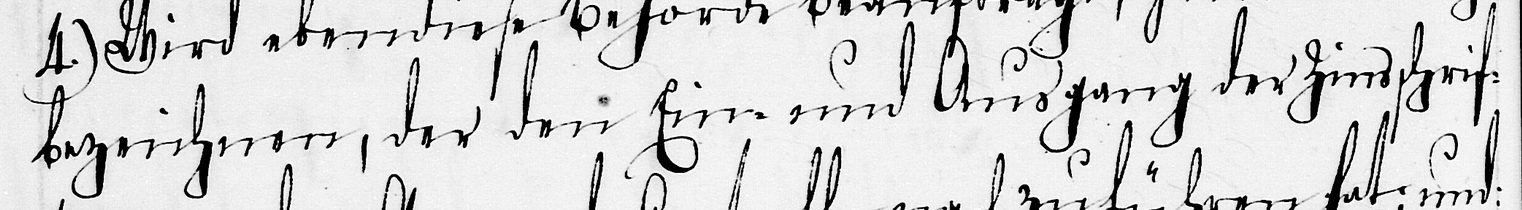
bezeichnen, der den Ein- und Auszug der Zinsschri¬
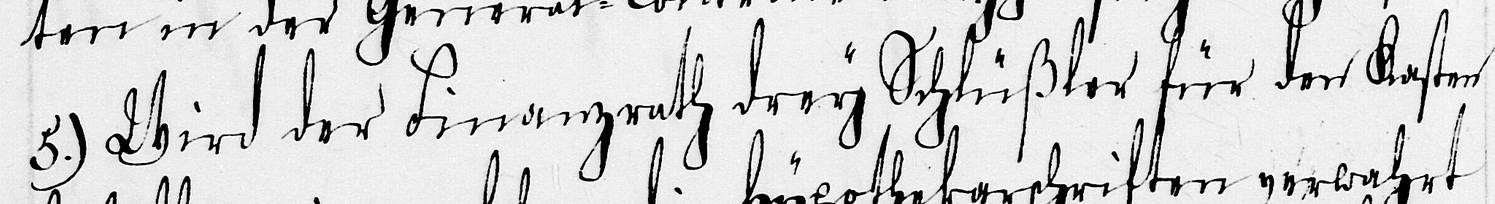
5.) Wird der Finanzrath drey Schlüßler für den Kasten
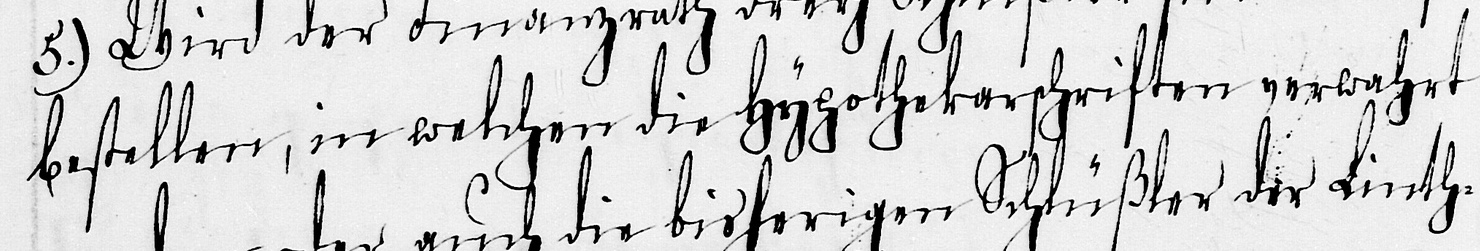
bestellen, in welchen die Hypothekarschriften verwahrt
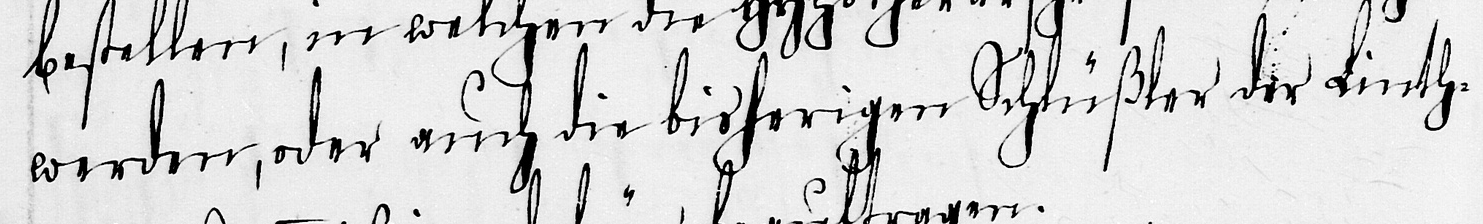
werden, oder auch die bisherigen Schlüßler der Linth¬
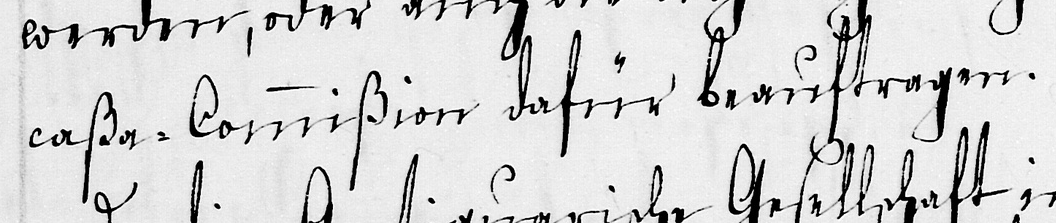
caßa-Commißion dafür beauftragen.
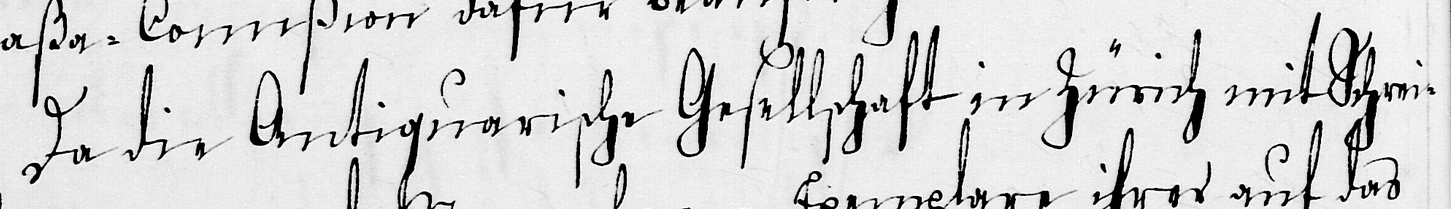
Da die Antiquarische Gesellschaft in Zürich mit Schre¬
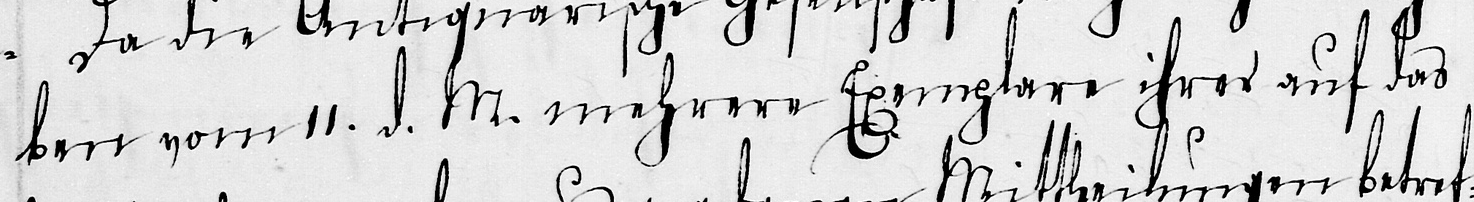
iben vom 11. d. M. mehrere Exemplare ihrer auf das
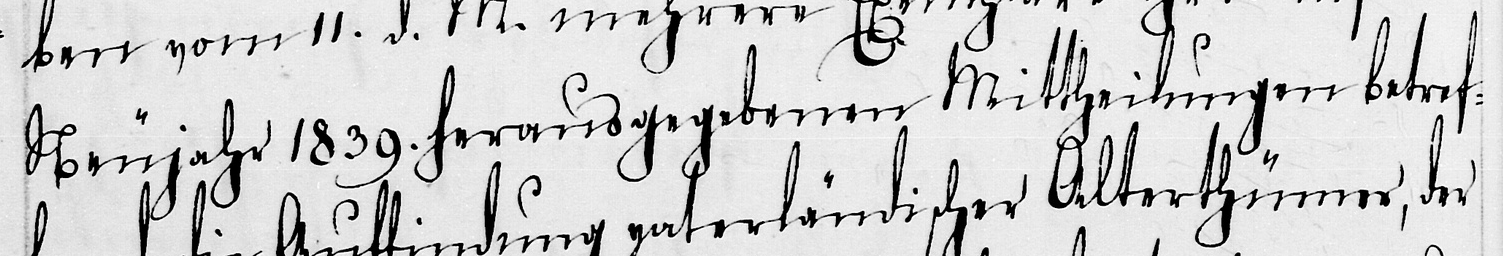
Neujahr 1839. herausgegebenen Mittheilungen betref¬
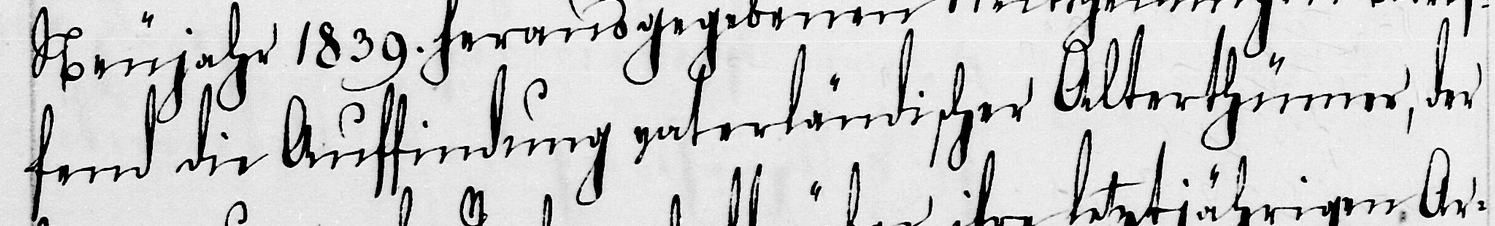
fend die Auffindung vaterländischer Alterthümer, der
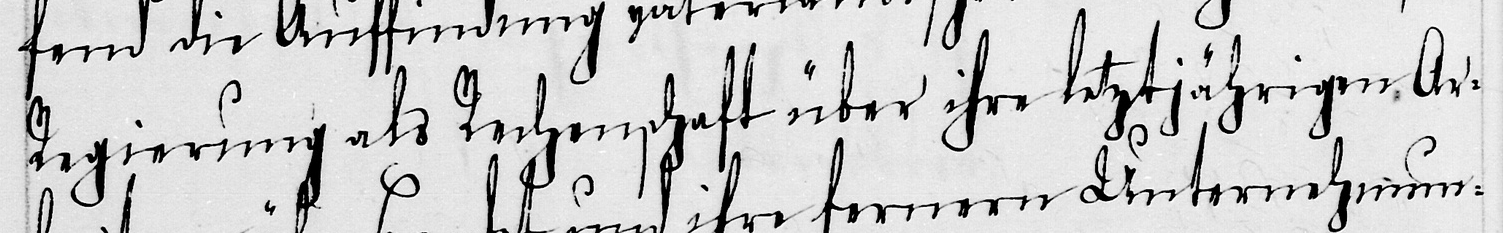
Regierung als Rechenschaft über ihre letztjährigen Ar¬
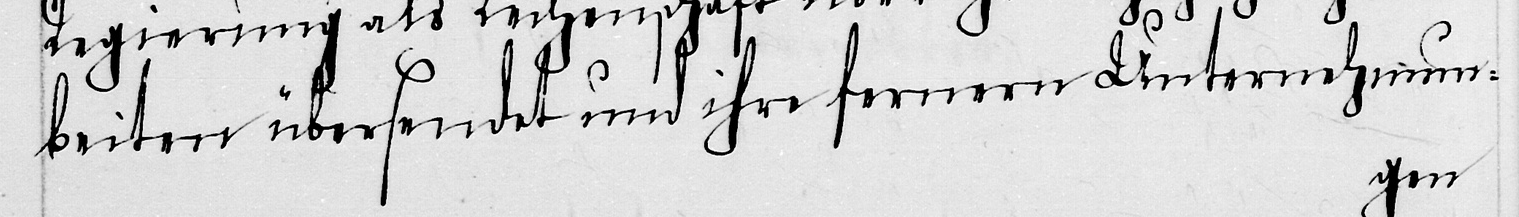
beiten übersendet und ihre fernern Unternehmun-
